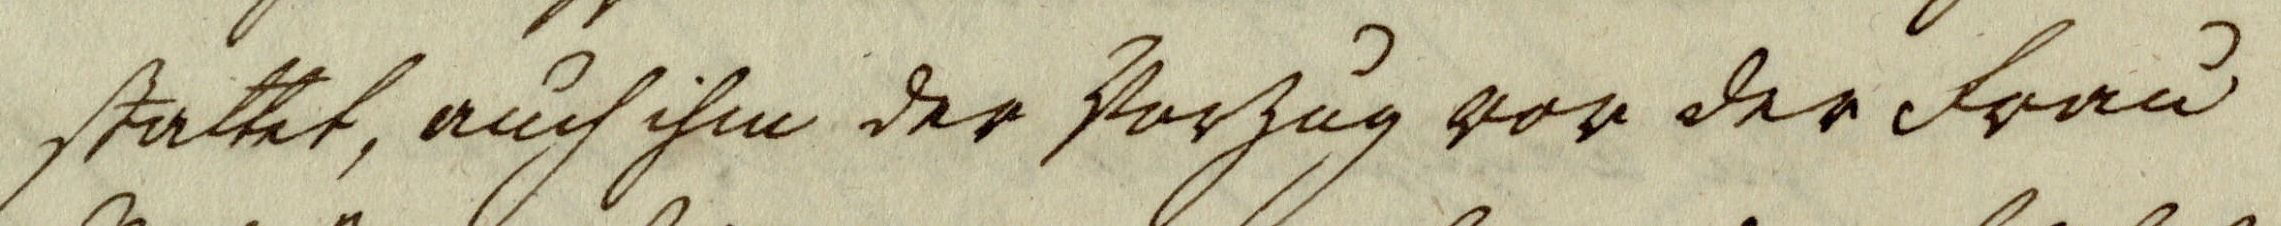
stattet, auch ihm der Vorzug vor der Frau
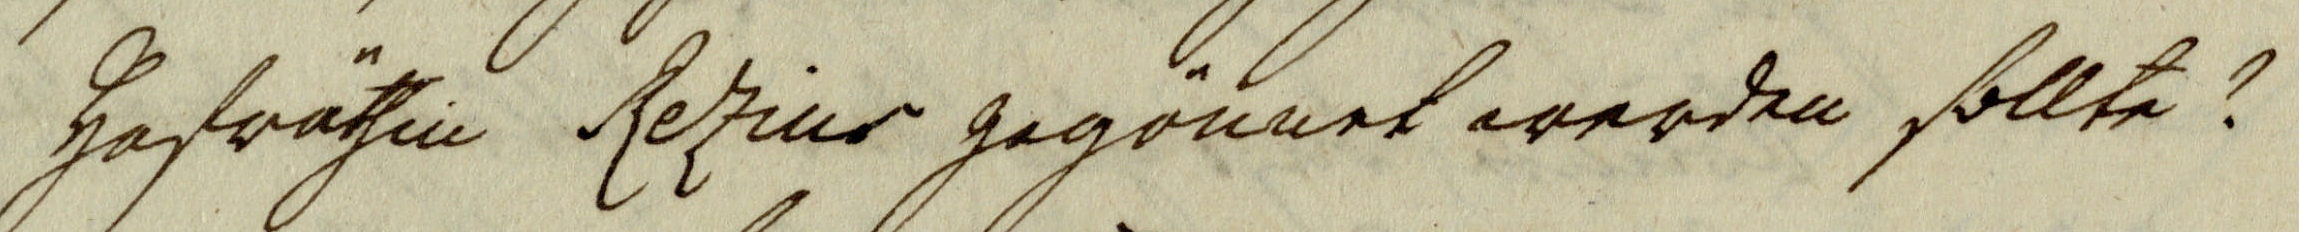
Hofräthin Rezius gegönnet werden sollte?
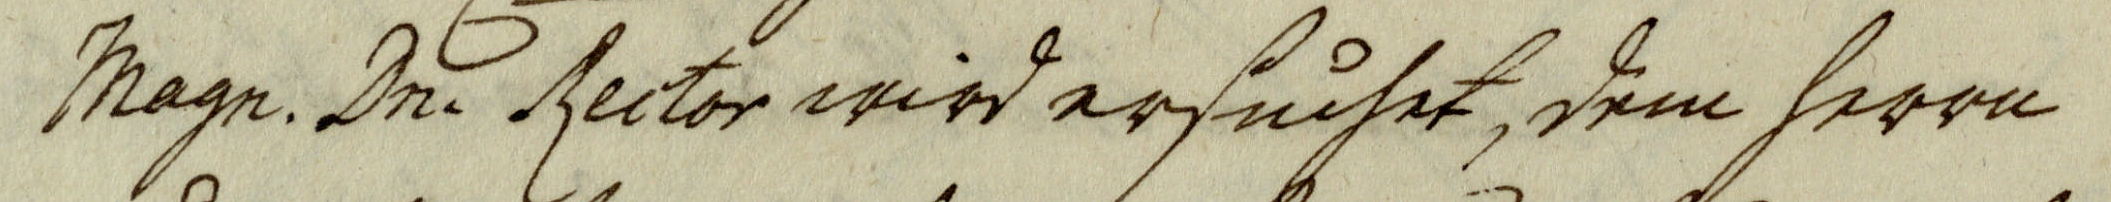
Magn. Dn. Rector wird ersuchet, dem Herrn
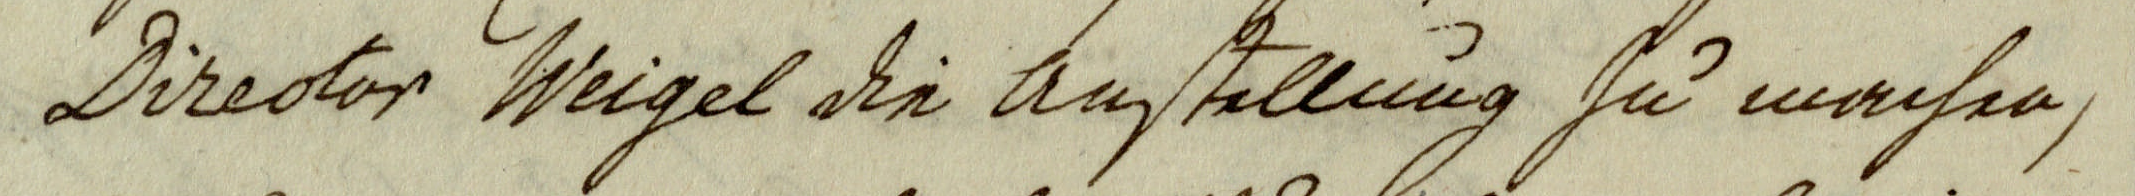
Director Weigel die Anstellung zu machen,
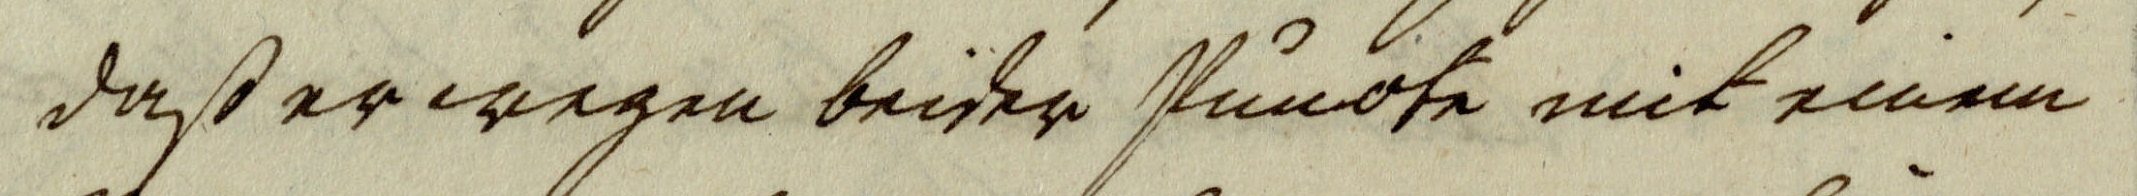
daß er wegen beider Puncte mit einem
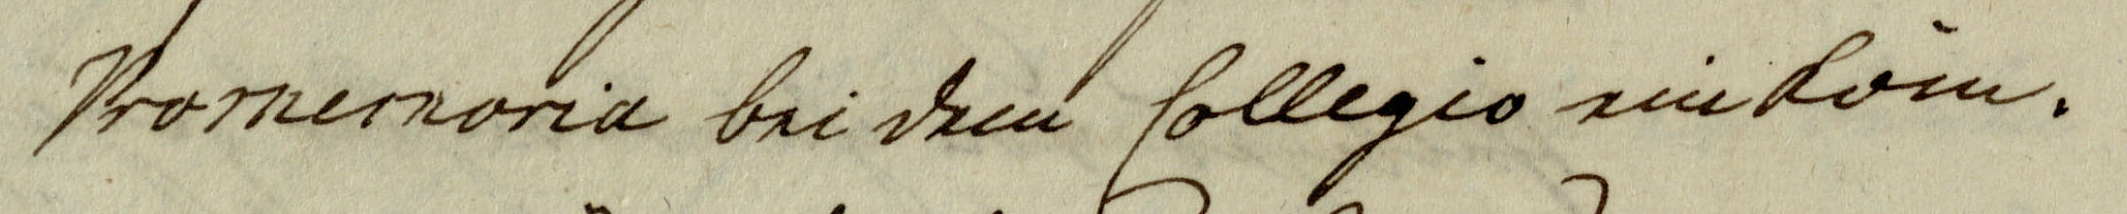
Promemoria bei dem Collegio einkom¬
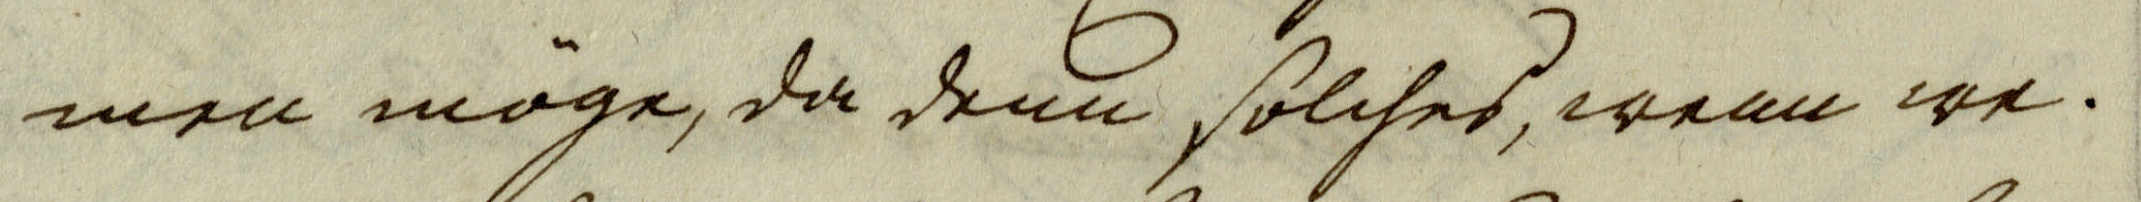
men möge, da denn solches, wenn we¬
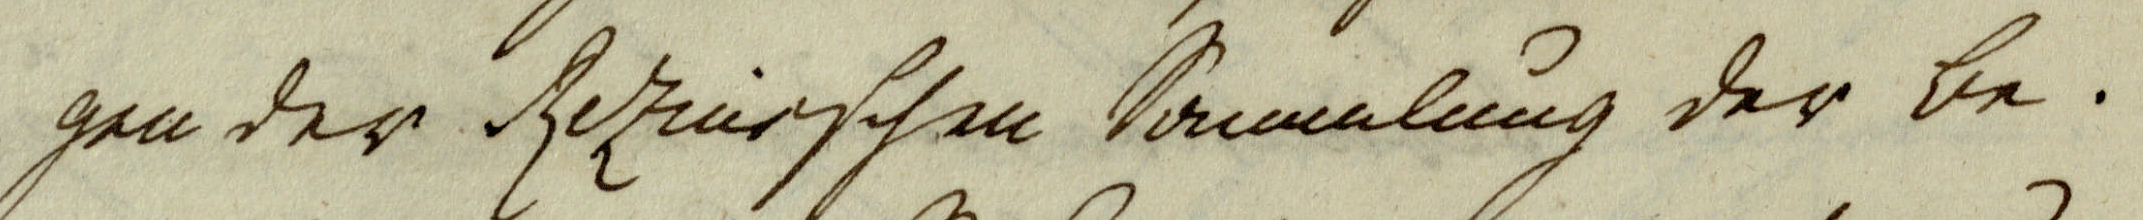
gen der Reziusschen Sammlung der Be¬
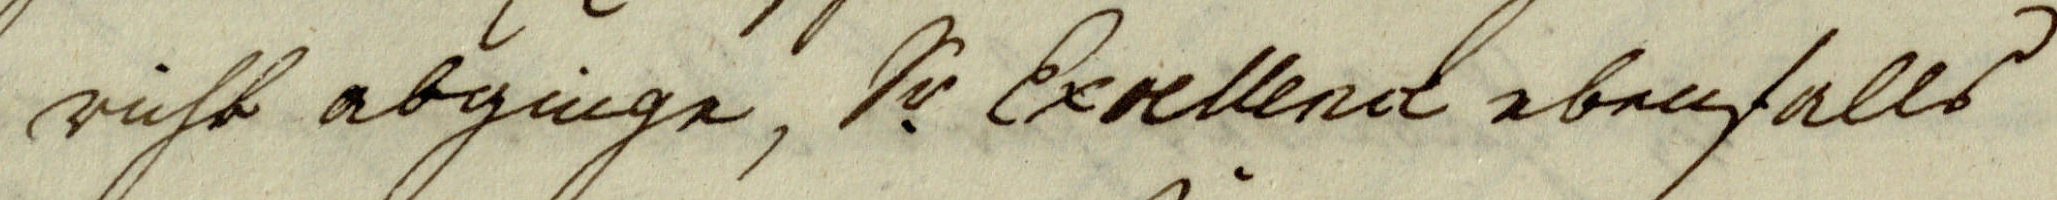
richt abginge, Sr. Excellence ebenfalls
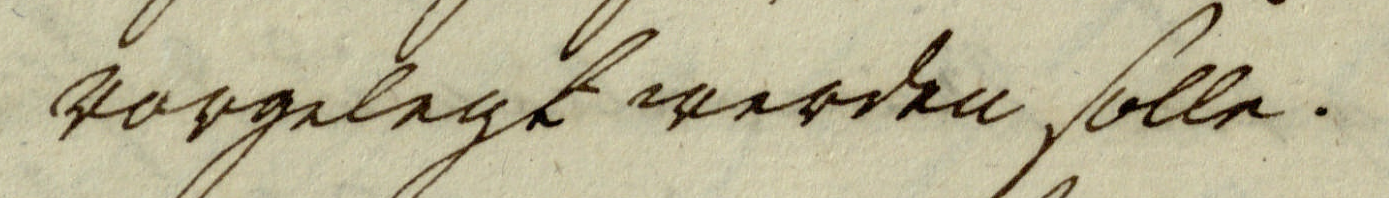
vorgelegt werden solle.
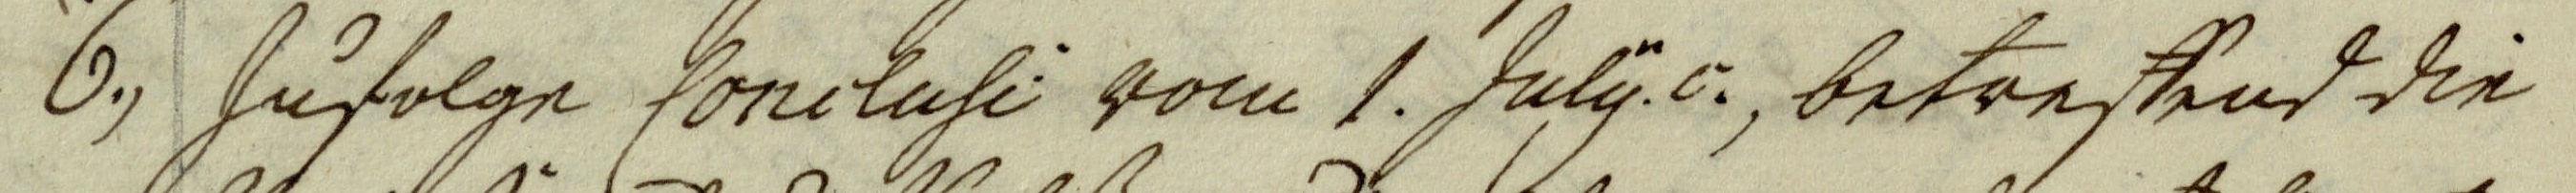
6., Zufolge Conclusi vom 1. Julÿ. c., betreffend die
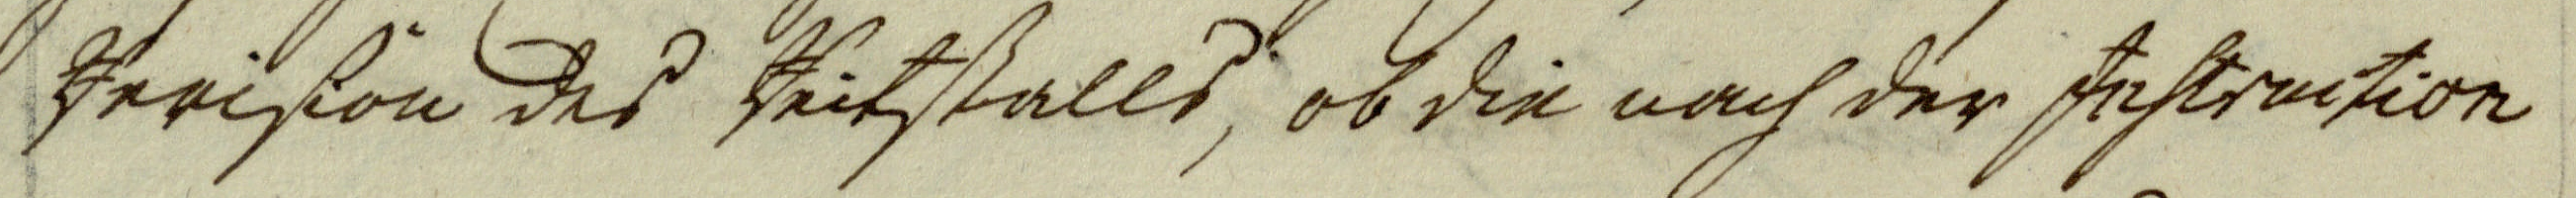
Revision des Reitstalls, ob die nach der Instruction
